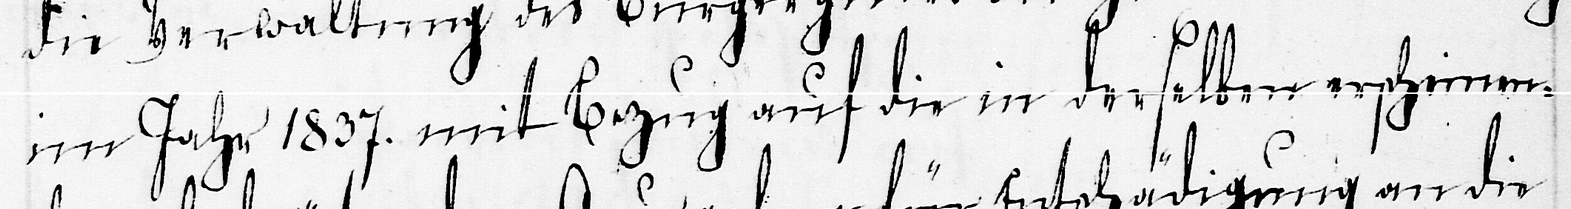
im Jahr 1837. mit Bezug auf die in derselben erscheinen¬
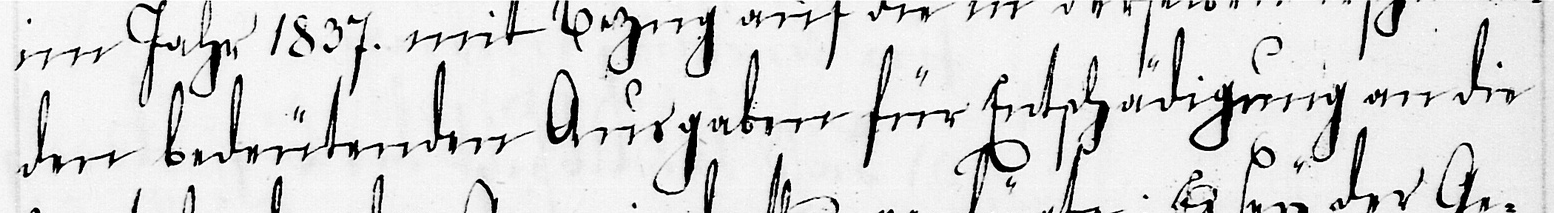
den bedeutenden Ausgaben für Entschädigung an die
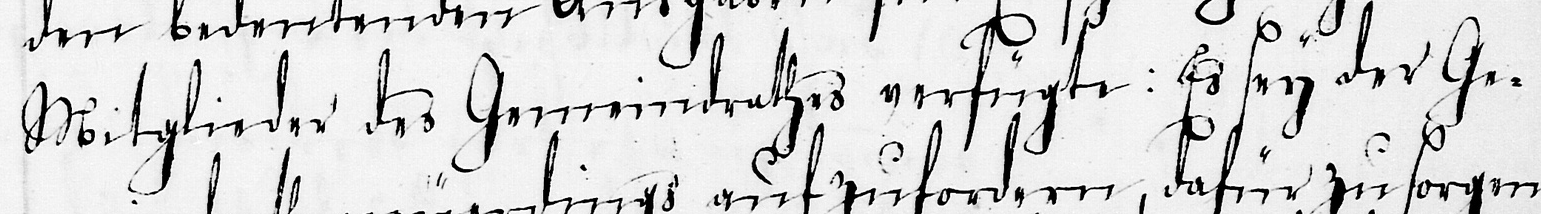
Mitglieder des Gemeindrathes verfügte: Es sey der Ge¬
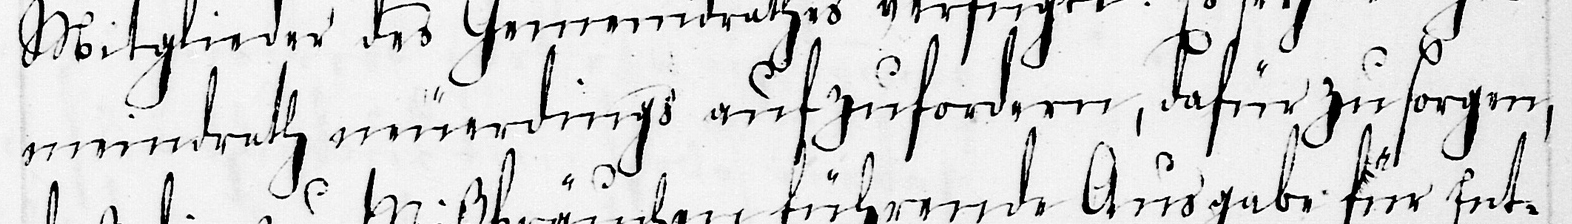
meindrath neuerdings aufzufordern, dafür zu sorgen,
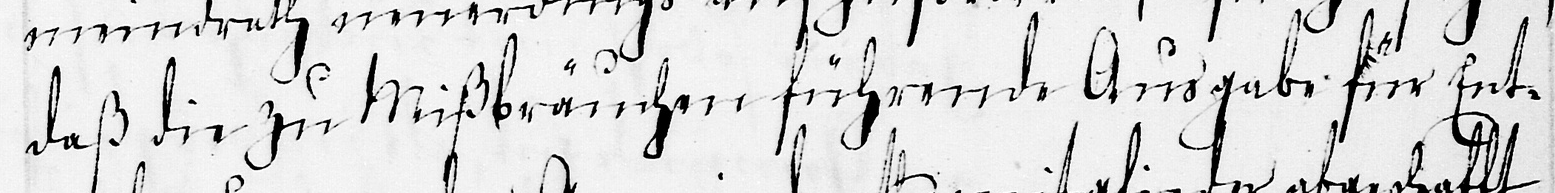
daß die zu Mißbräuchen führende Ausgabe für Ent¬
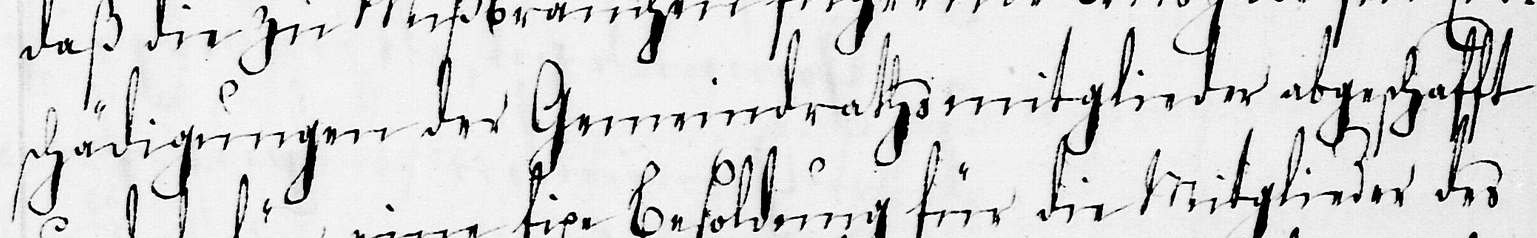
schädigungen der Gemeindrathsmitglieder abgeschafft
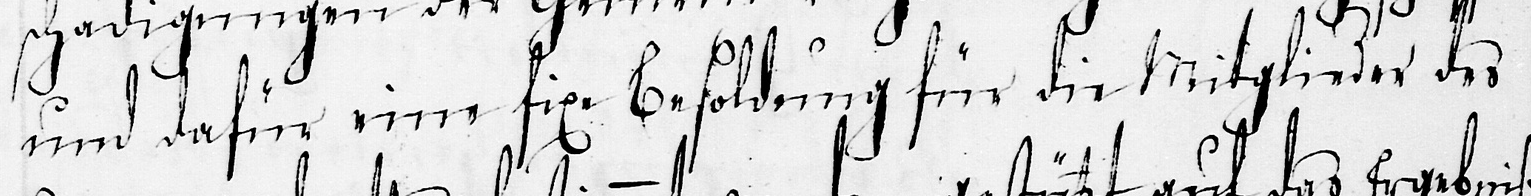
und dafür eine fixe Besoldung für die Mitglieder des
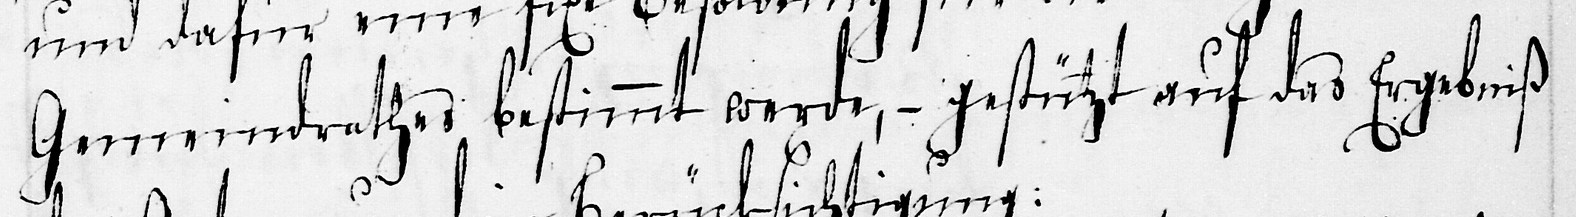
Gemeindrathes bestimmt werde, – gestützt auf das Ergebniß
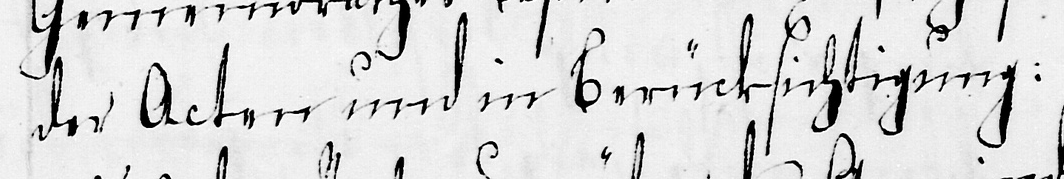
der Acten und in Berücksichtigung:
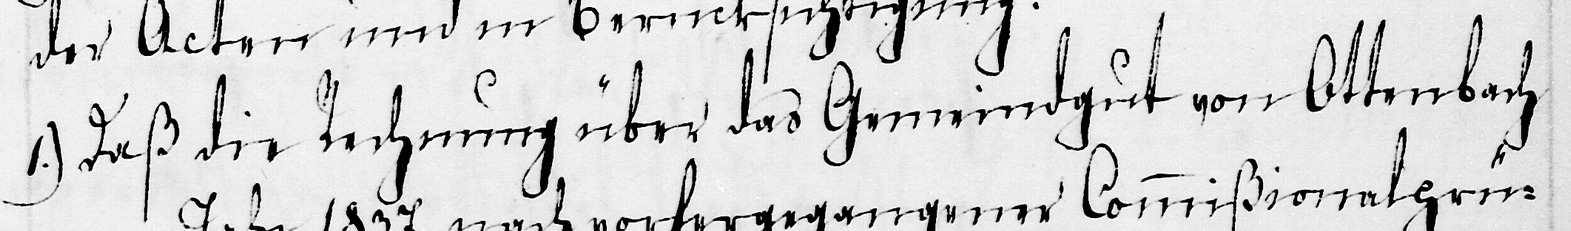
1.) Daß die Rechnung über das Gemeindgut von Ottenbach
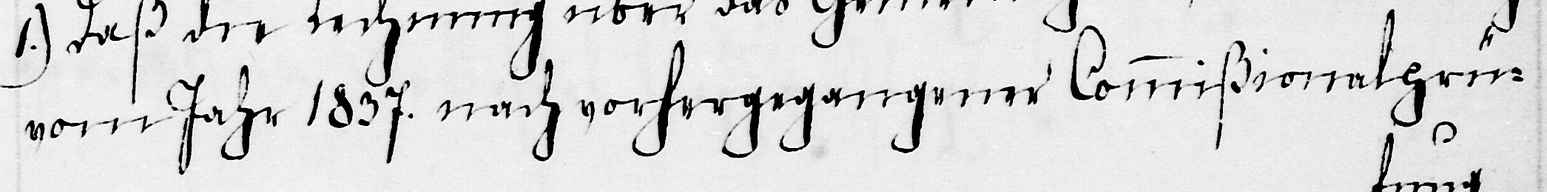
vom Jahr 1837. nach vorhergegangener Commißionalprü-
